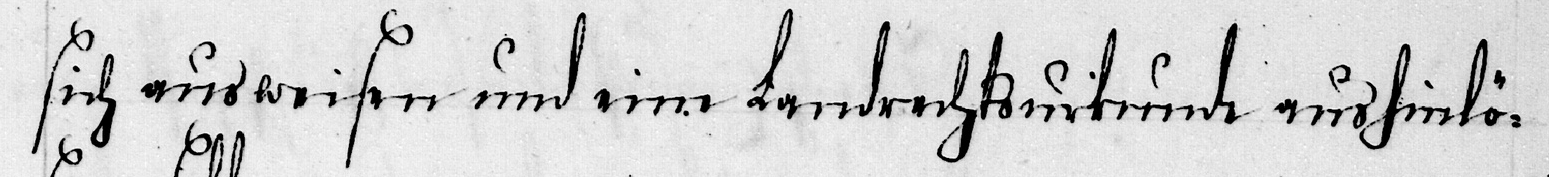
sich ausweisen und eine Landrechtsurkunde aushinlö¬
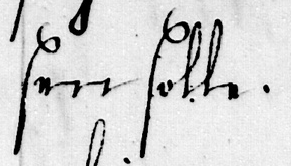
sen solle.
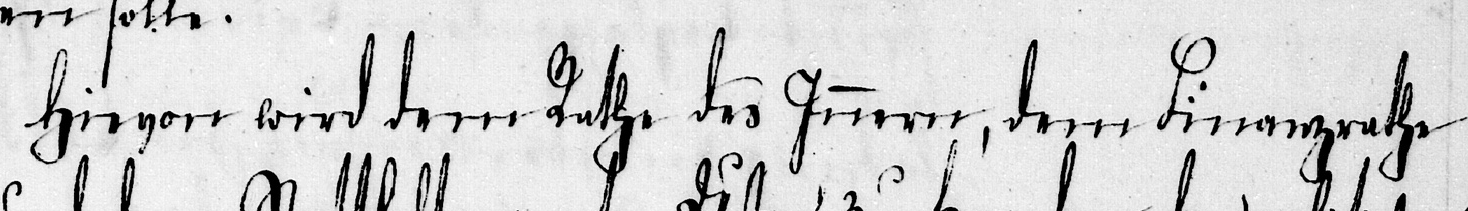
Hievon wird dem Rathe des Innern, dem Finanzrathe
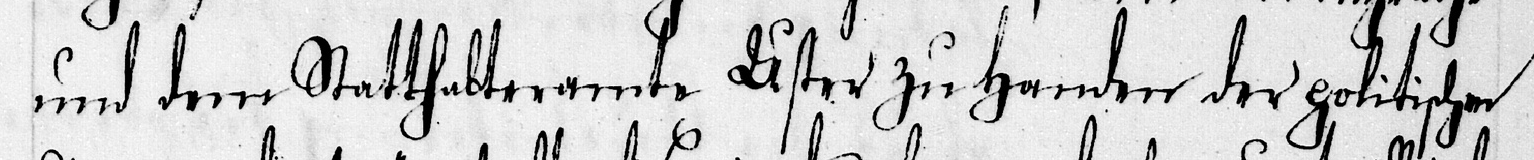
und dem Statthalteramte Uster zu Handen der politischen
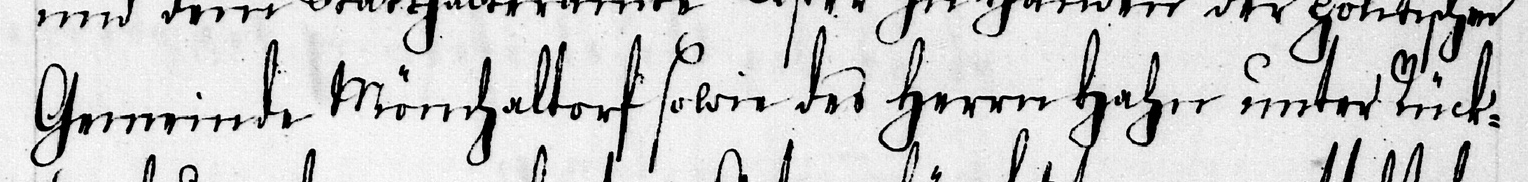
Gemeinde Mönchaltorf sowie des Herrn Hahn unter Rück¬
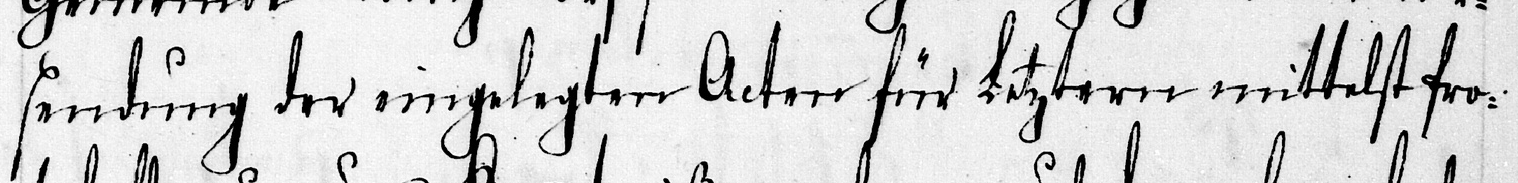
sendung der eingelegten Acten für Letztern mittelst Pro¬
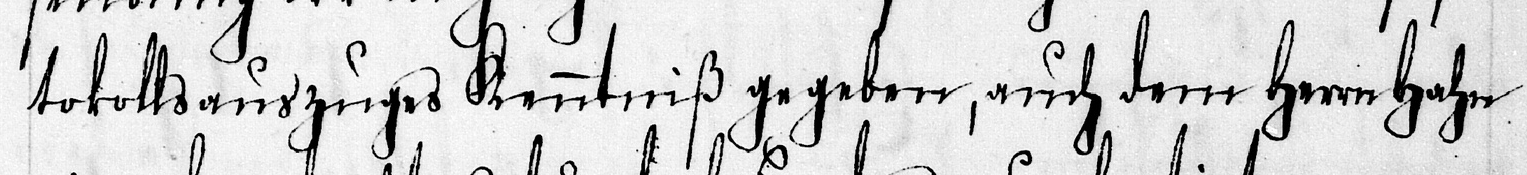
tokollsauszuges Kenntniß gegeben, auch dem Herrn Hahn
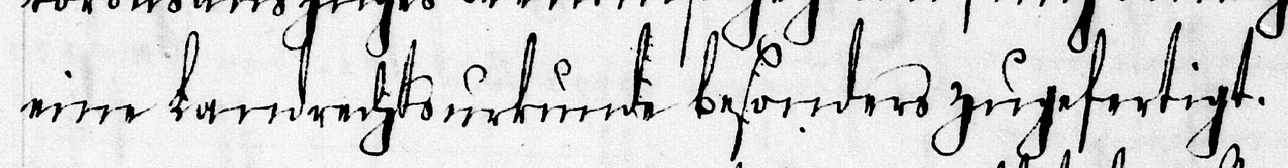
eine Landrechtsurkunde besonders zugefertigt.
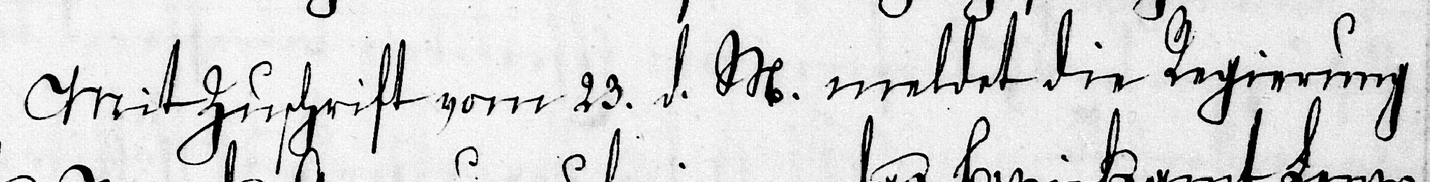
Mit Zuschrift vom 23. d. M. meldet die Regierung
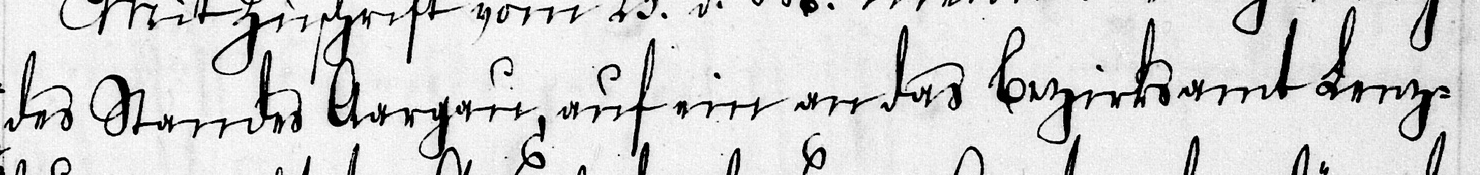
des Standes Aargau, auf ein an das Bezirksamt Lenz¬
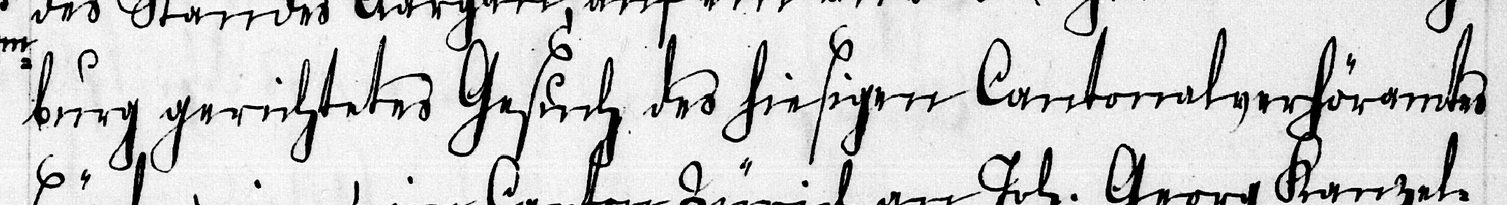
burg gerichtetes Gesuch des hiesigen Cantonalverhöramtes
